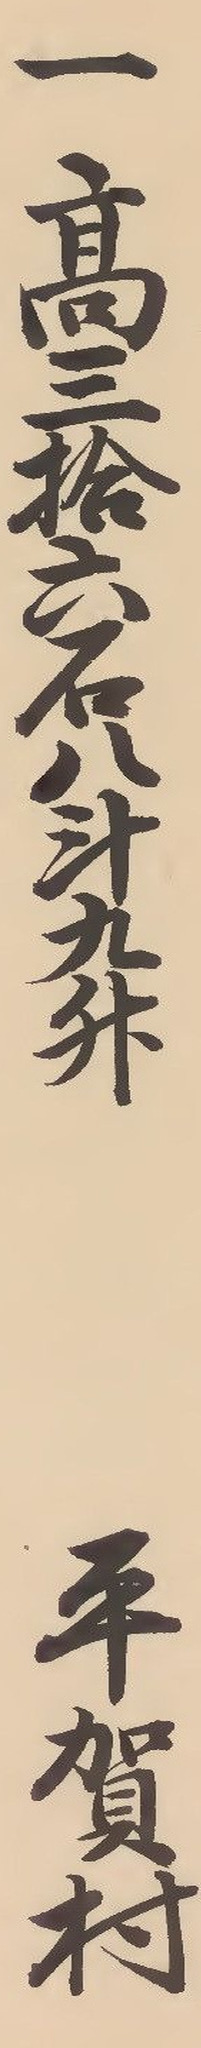一高三拾六石八斗九升平賀村
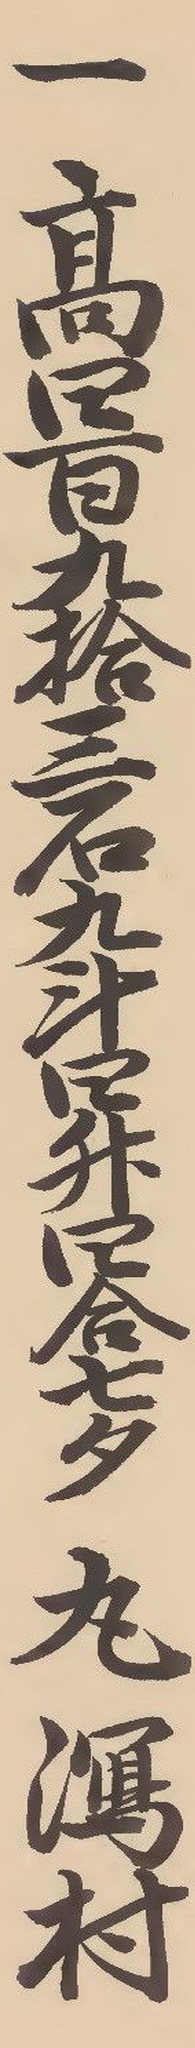一高四百九拾三石九斗四升四合七勺丸潟村
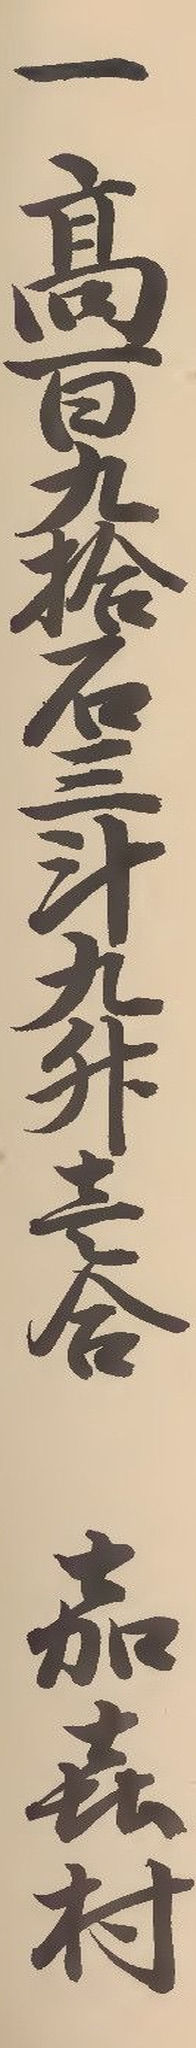一高百九拾石三斗九升壱合嘉喜村
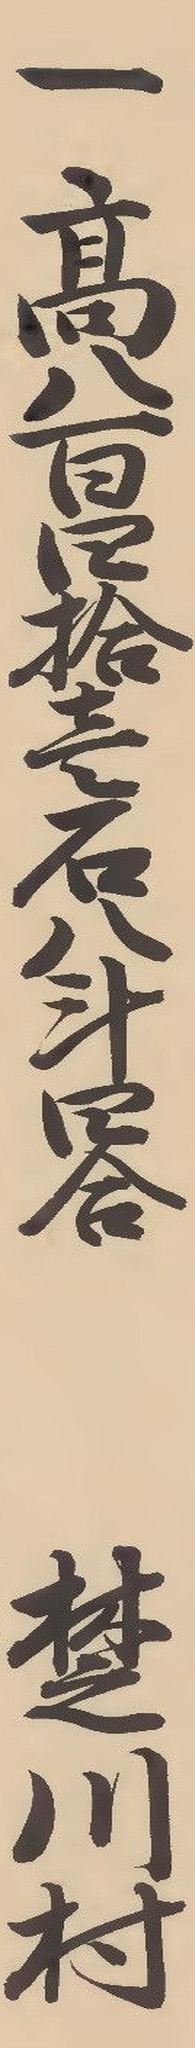一高八百四拾壱石八斗四合楚川村
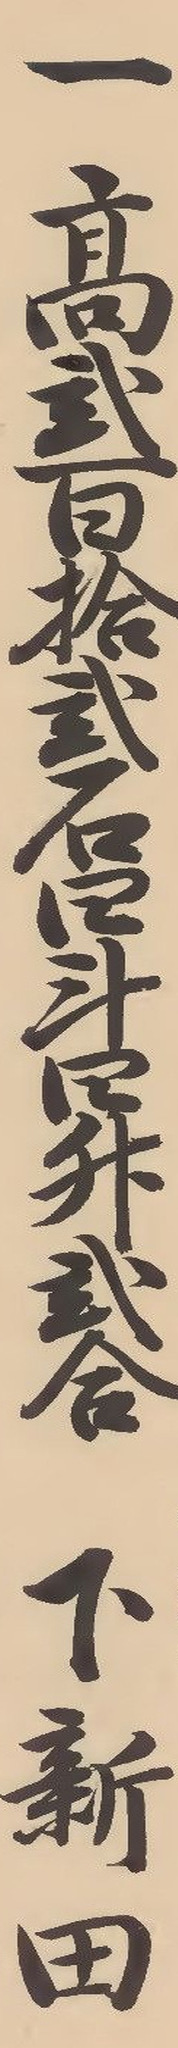一高弐百拾弐石四斗四升弐合下新田
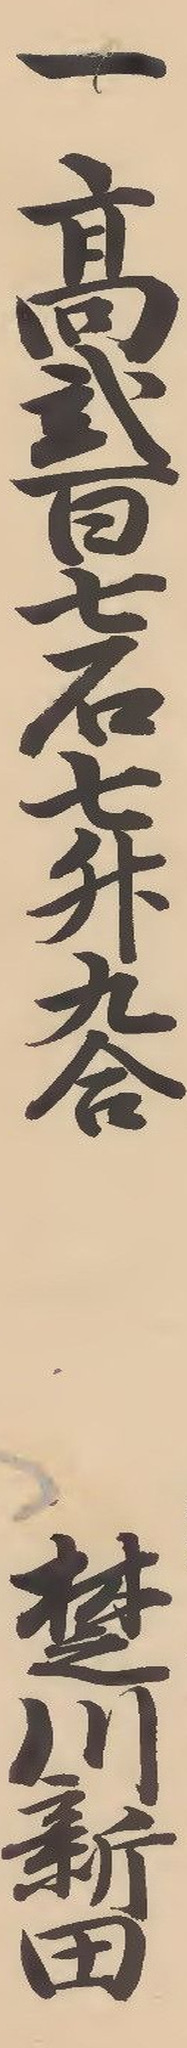一高弐百七石七升九合楚川新田

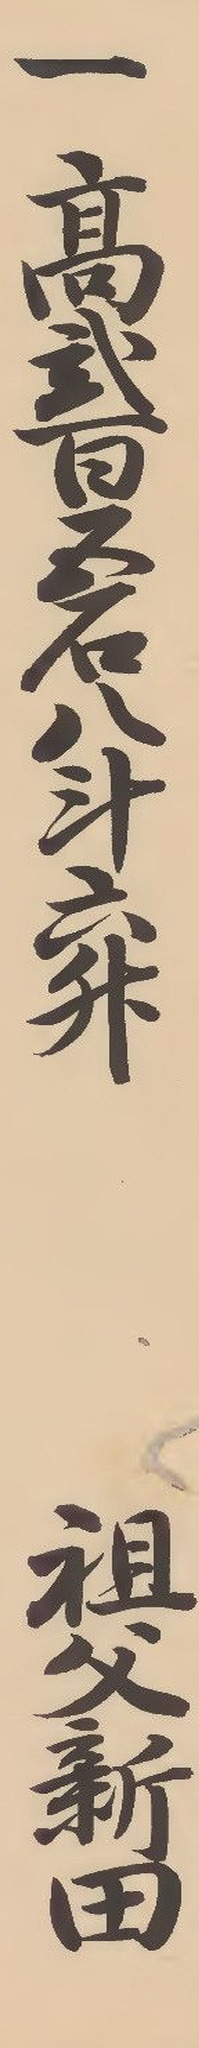一高弐百五石八斗六升祖父新田
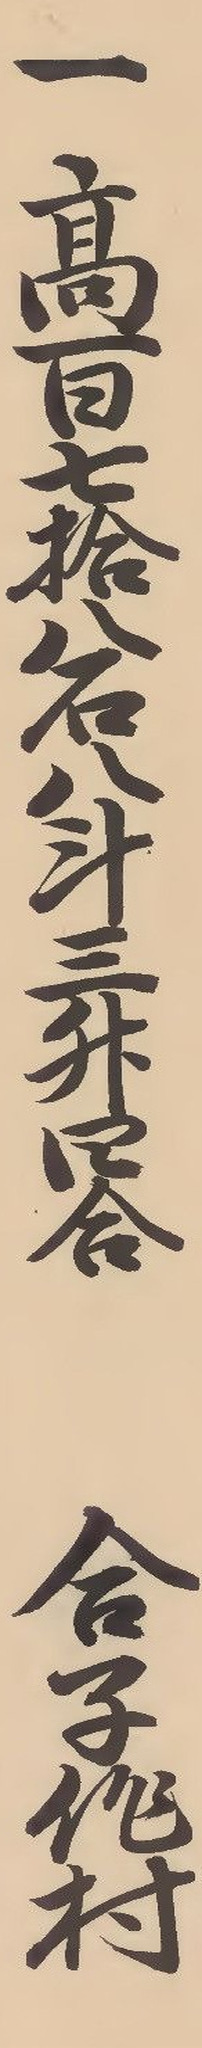一高百七拾八名八斗三升四合合子作村
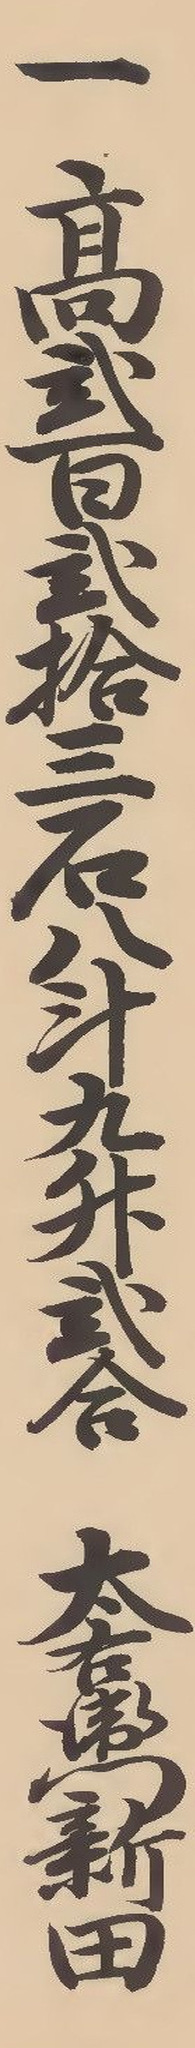一高弐百弐拾三石八斗九升弐合太右衛門新田
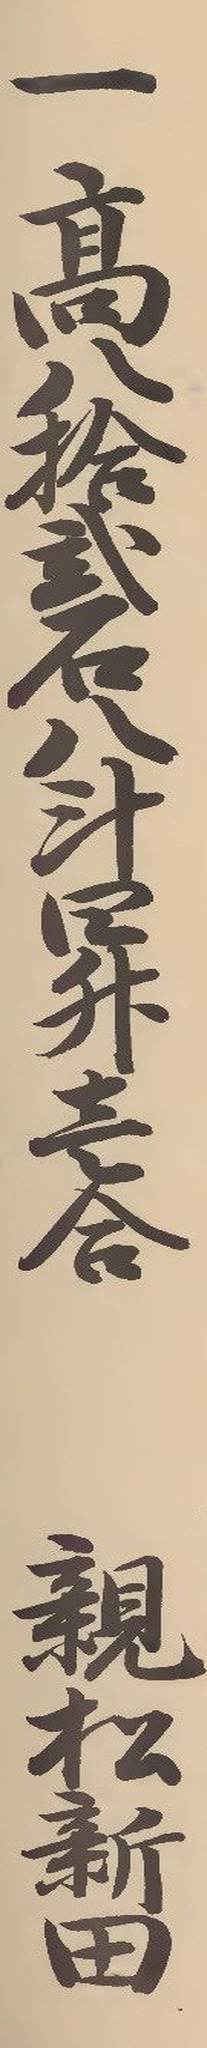一高八拾弐石八斗四升壱合親松新田
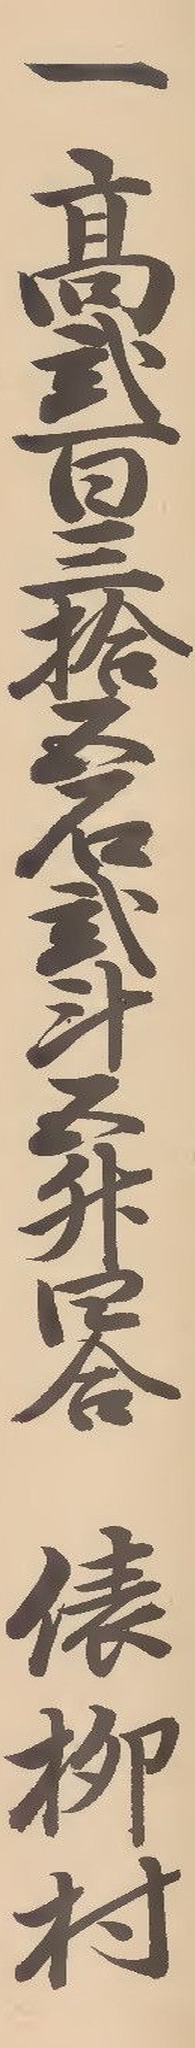一高弐百三拾五石弐斗五升四合俵柳村
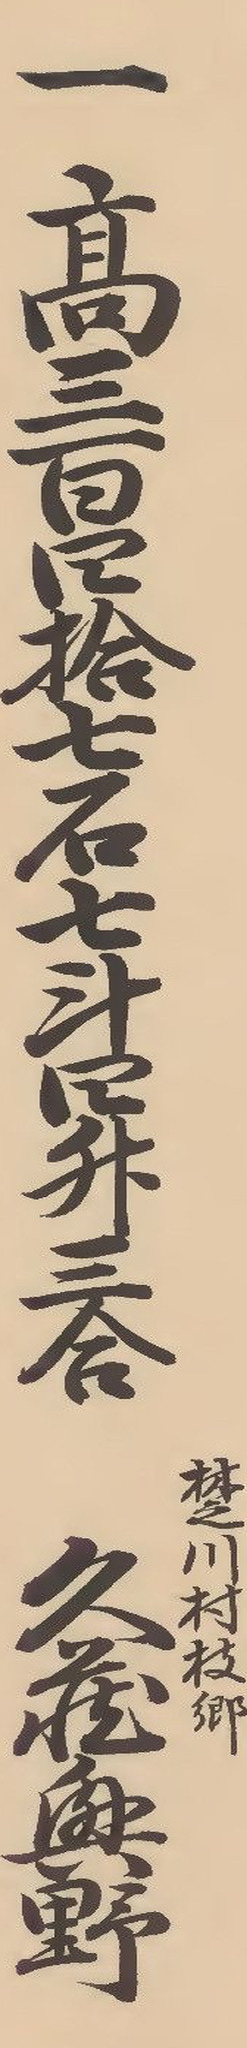一高三百四拾七石七斗四升三合久蔵興野
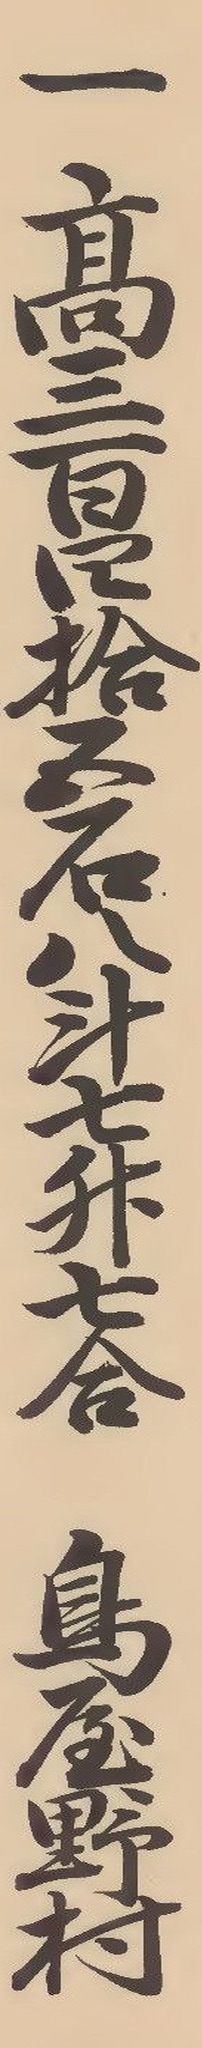一高三百四拾五石八斗七升七合鳥屋野村
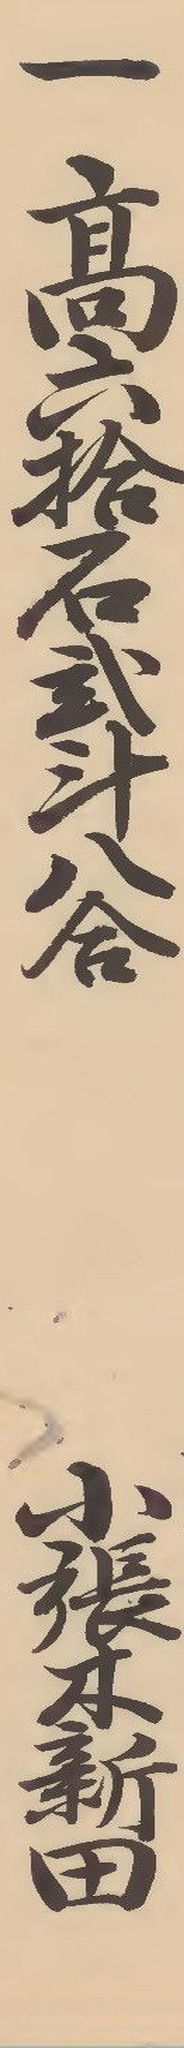一高六拾石弐斗八合小張木新田

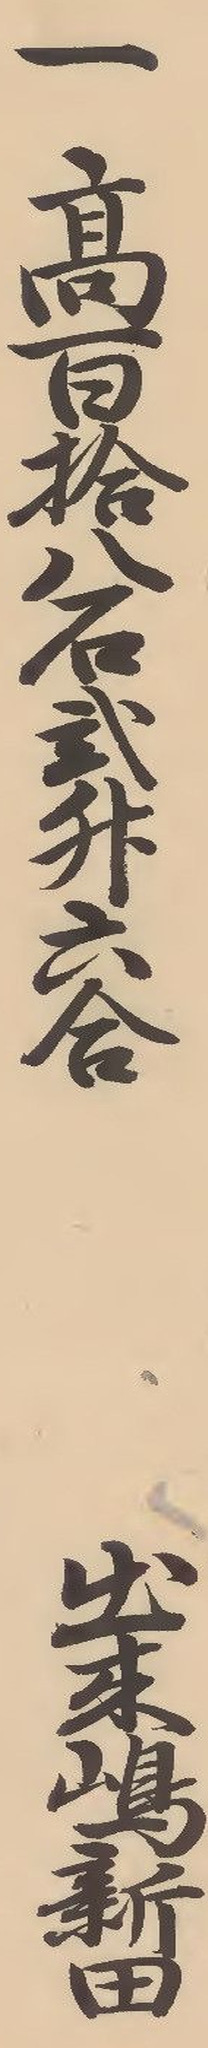一高百拾八石弐升六合出来島新田
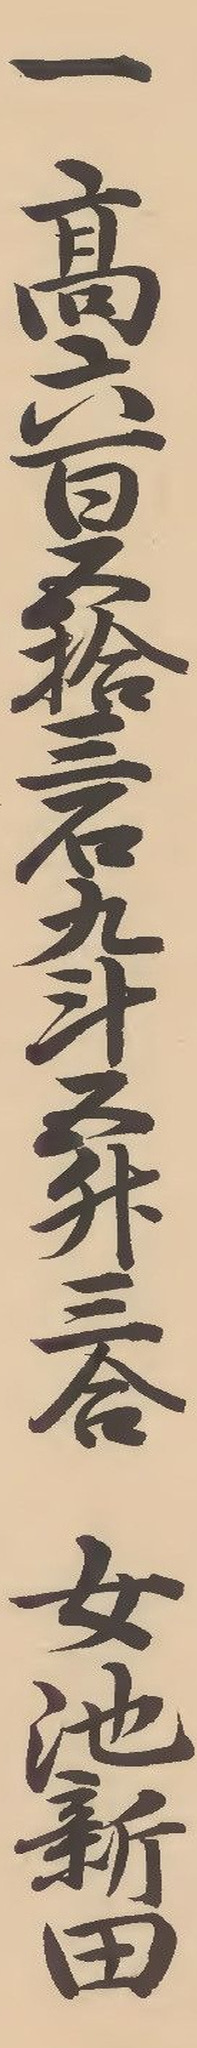一高六百五拾三石九斗五升三合女池新田
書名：越後国郷帳　下
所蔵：国立公文書館 National Archives of Japan
